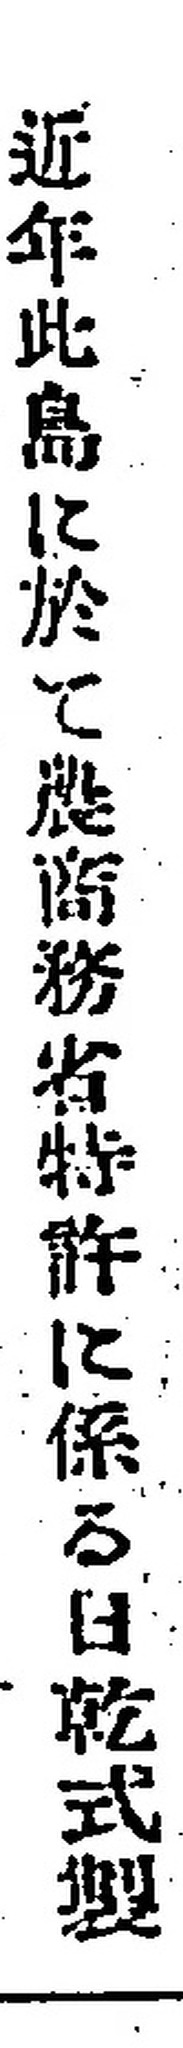近年此島に於て農商務省特許に係る日乾式製
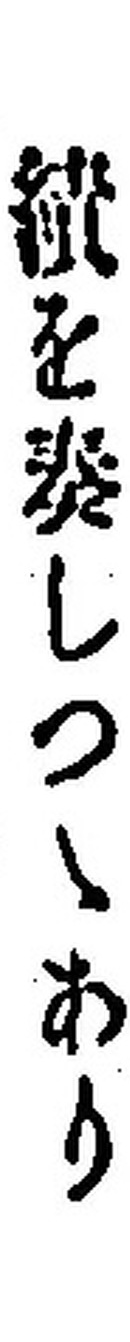績を奏しつゝあり
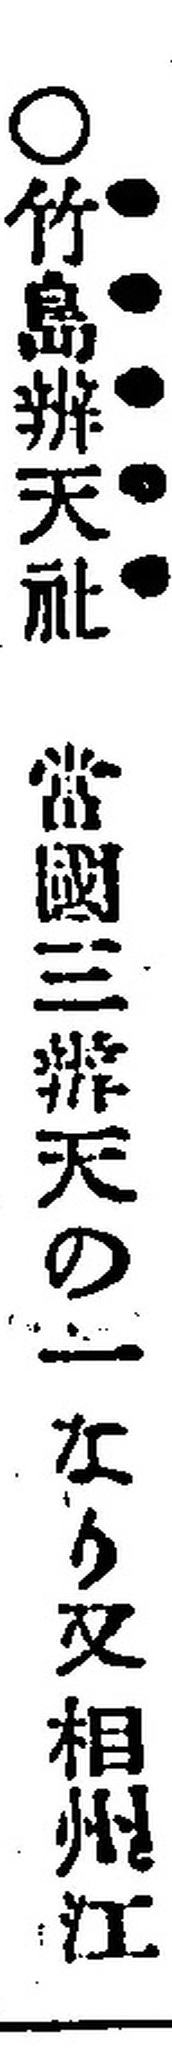○竹島弁天社当国三弁天の一なり又相州江
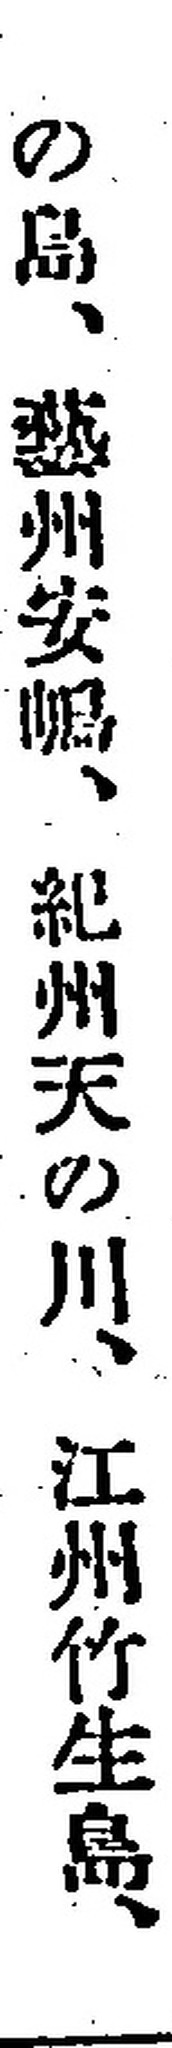の島、芸州安嶋、紀州天の川、江州竹生島、
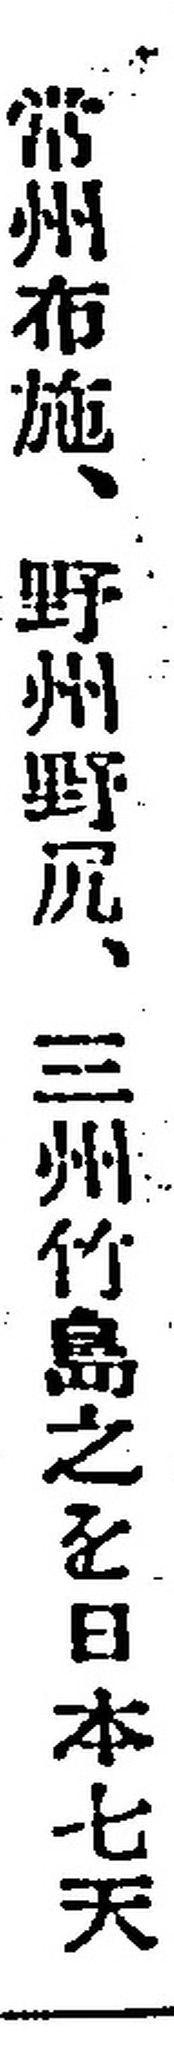常州布施、野州野尻、三州竹島之を日本七天
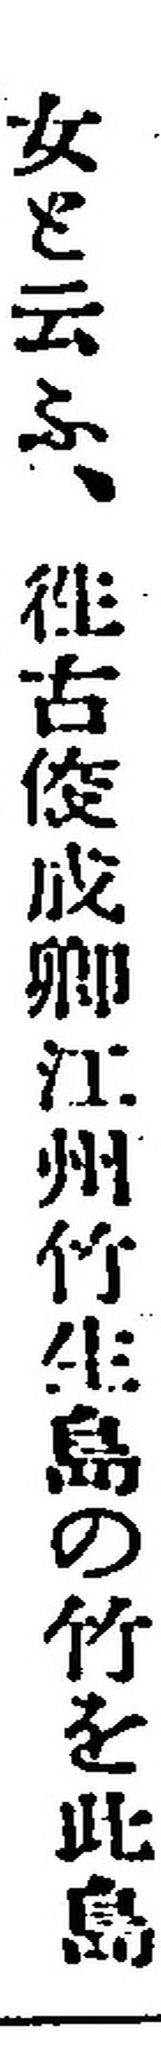女と云ふ、往古俊成卿江州竹生島の竹を此島
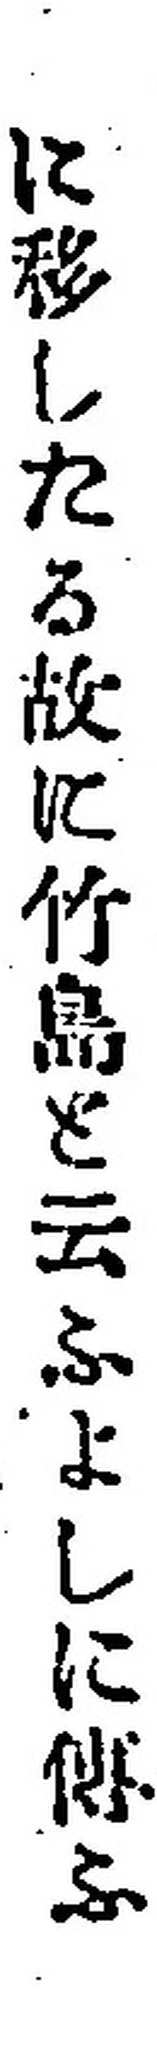に移したる故に竹島と云ふよしに伝ふ
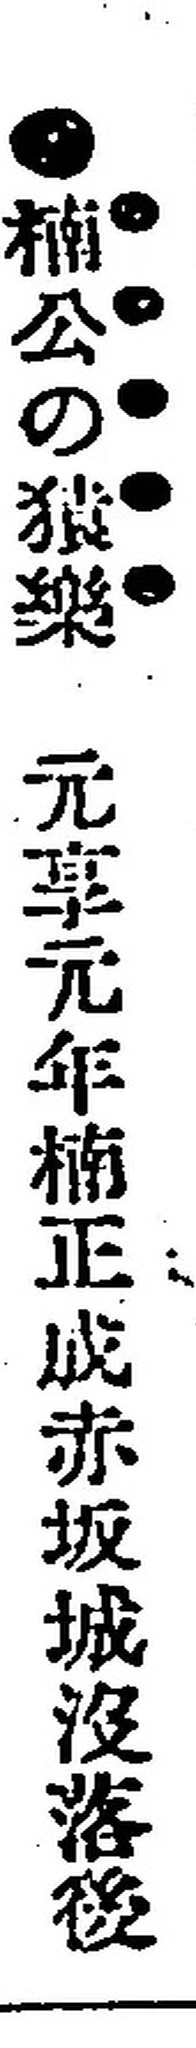●楠公の猿楽元享元年楠正成赤坂城没落後
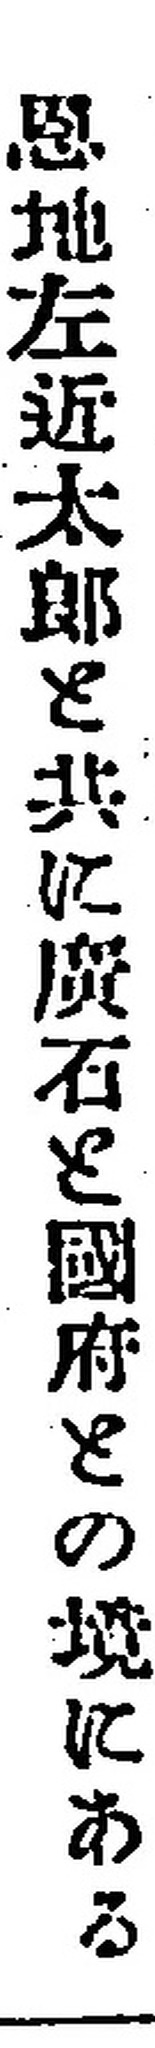恩地左近太郎と共に広石と国府との境にある
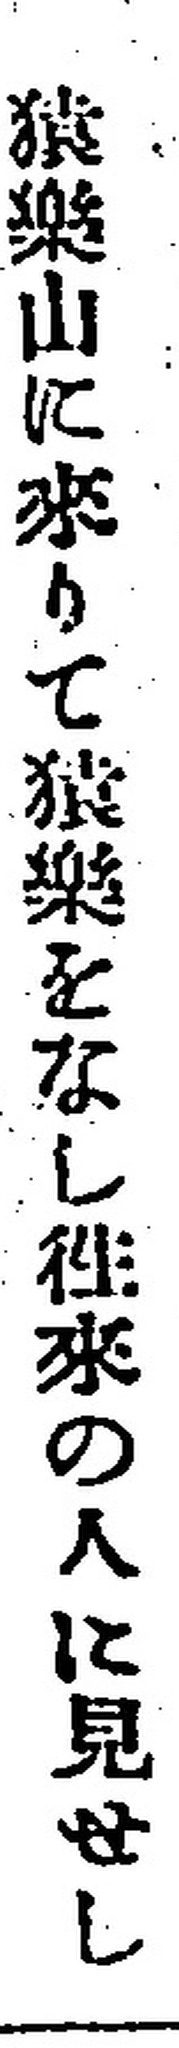猿楽山に来りて猿楽をなし往来の人に見せし
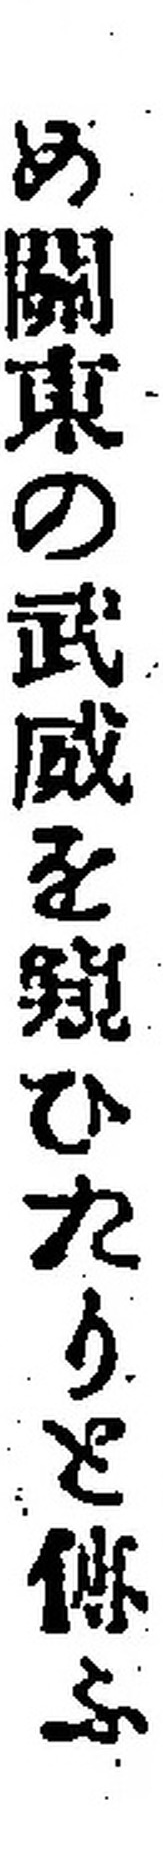め関東の武威を窺ひたりと伝ふ
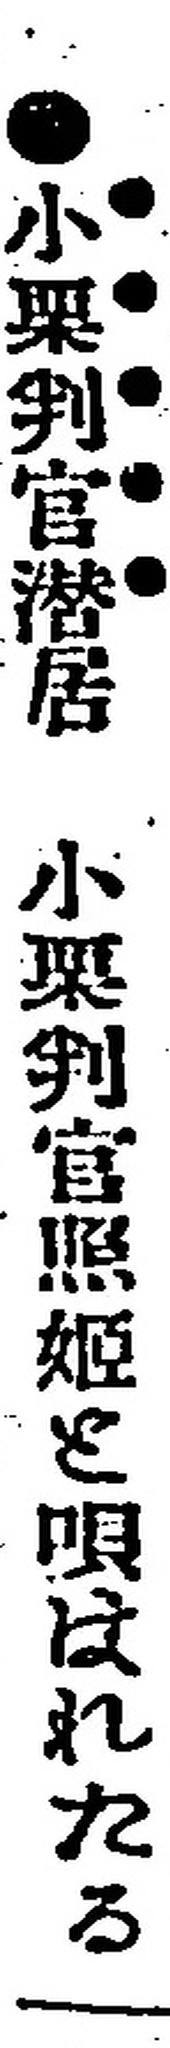●小栗判官潜居小栗判官照姫と唄はれたる
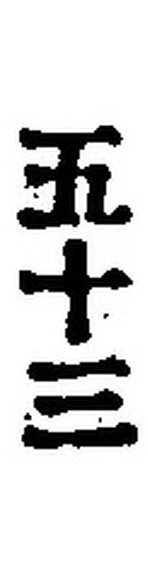五十三

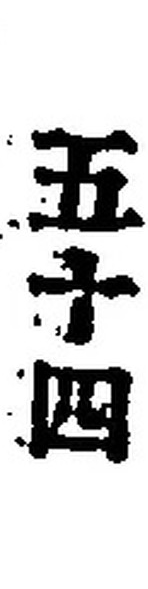五十四

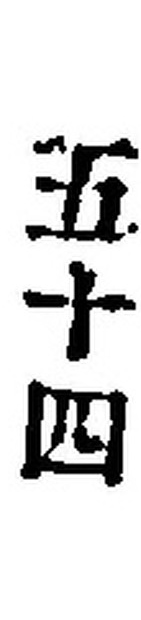五十四
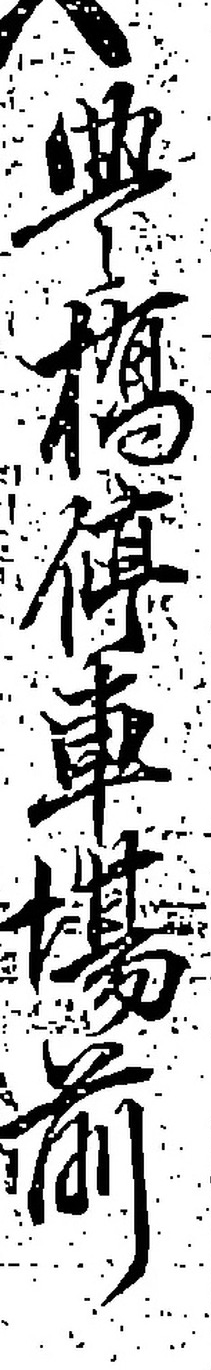豊橋停車場前
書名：東参名勝案内
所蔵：国立国会図書館 National Diet Library, JAPAN
